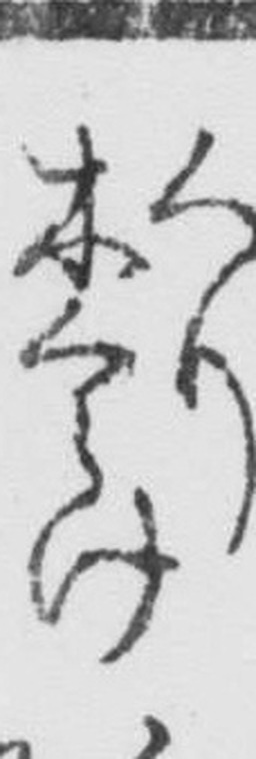木くらけ
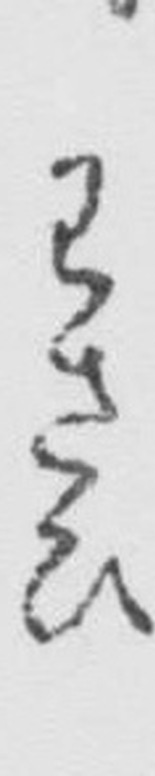わさひ
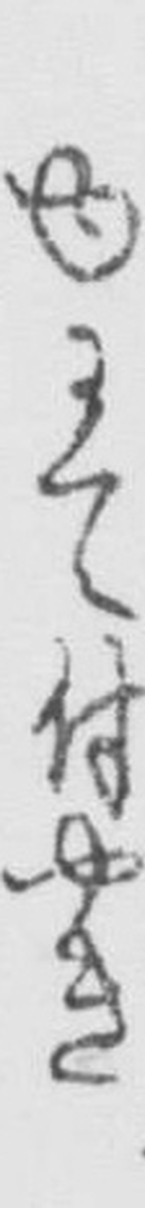ゆにて付やき
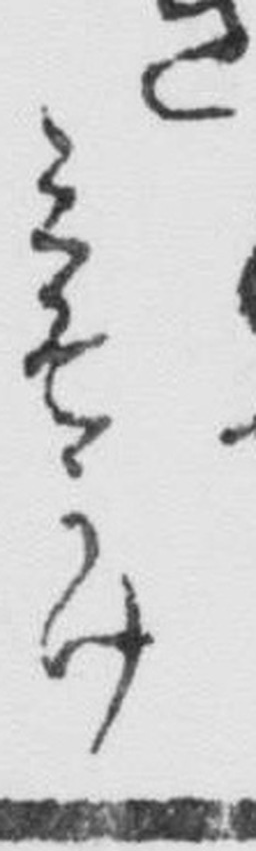みそかけ
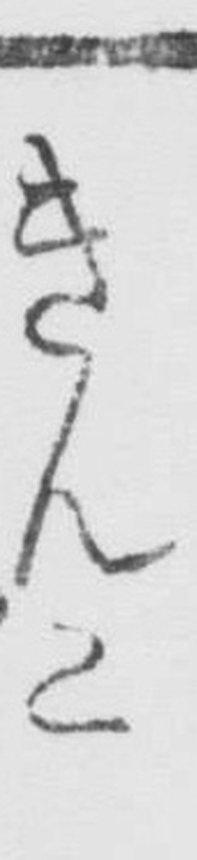きんこ
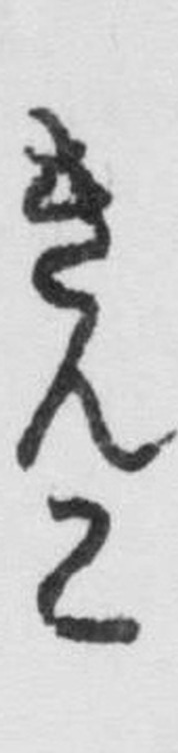きんこ
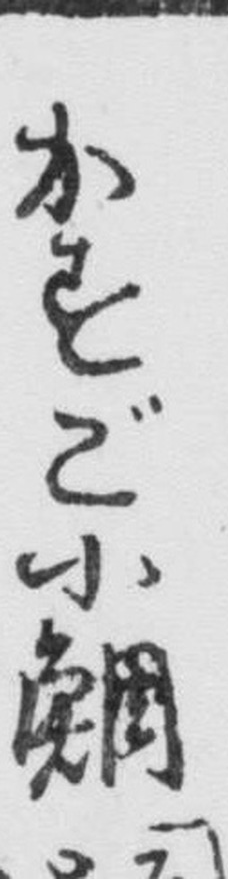かすご小鯛
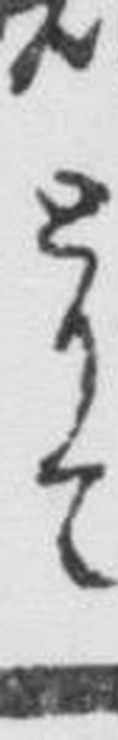とりて
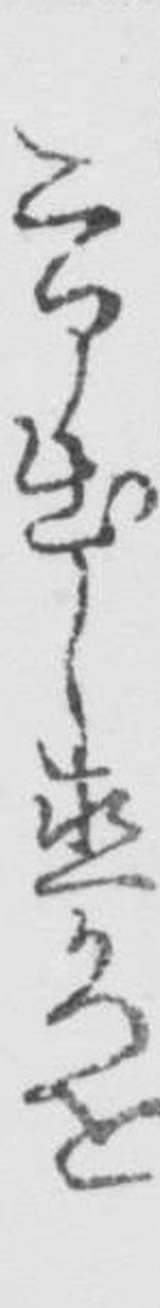こ部？出し置かつを
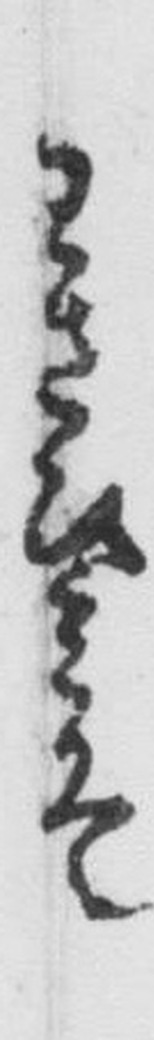わさひみそ
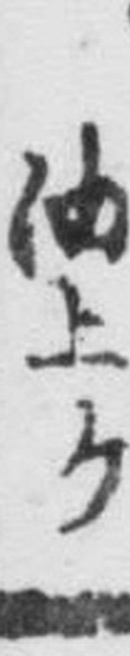油上け
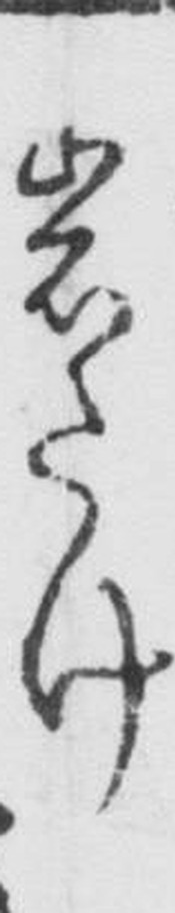岩たけ
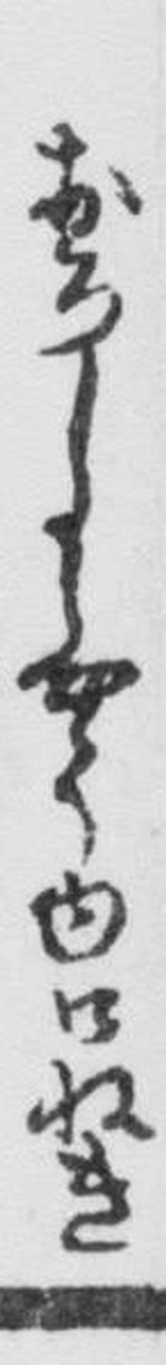おろししやうゆ口ねき
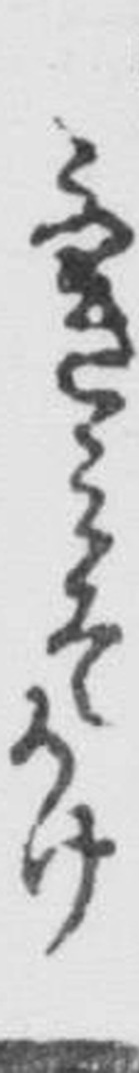ふきみそかけ
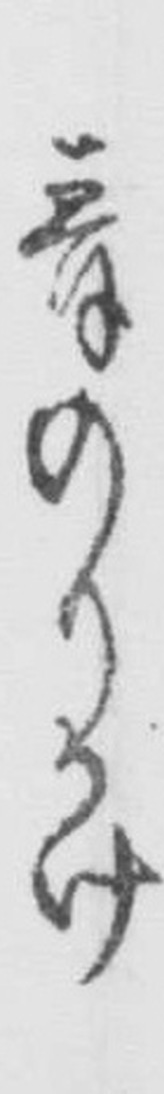青のりかけ
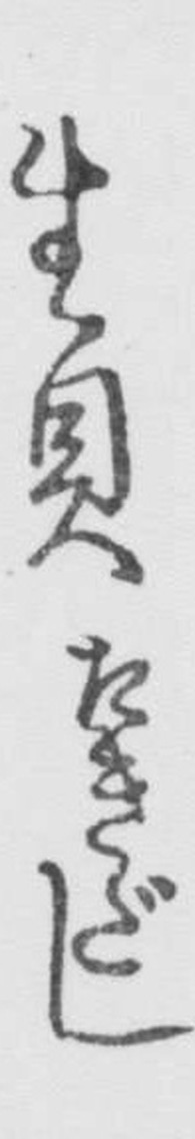生貝たきだし
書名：諸家通用/即席料理
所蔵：大阪府立大学学術情報センター 国文学研究資料館
